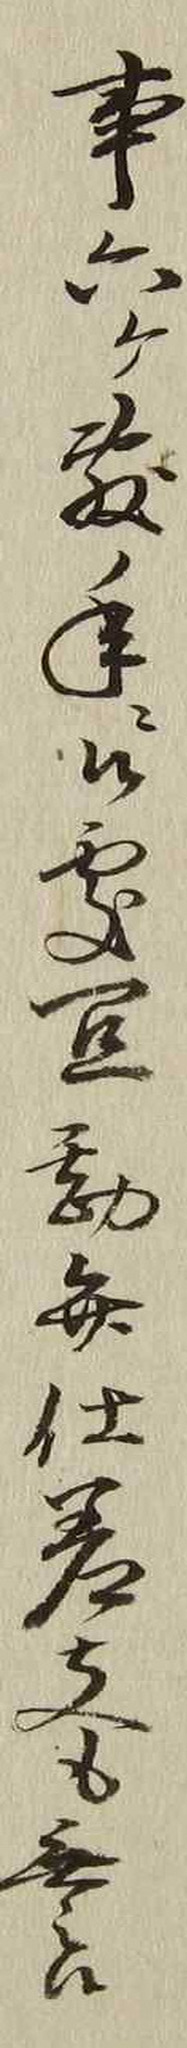事六ヶ敷年ニ候処宜勘弁仕差支も無之候
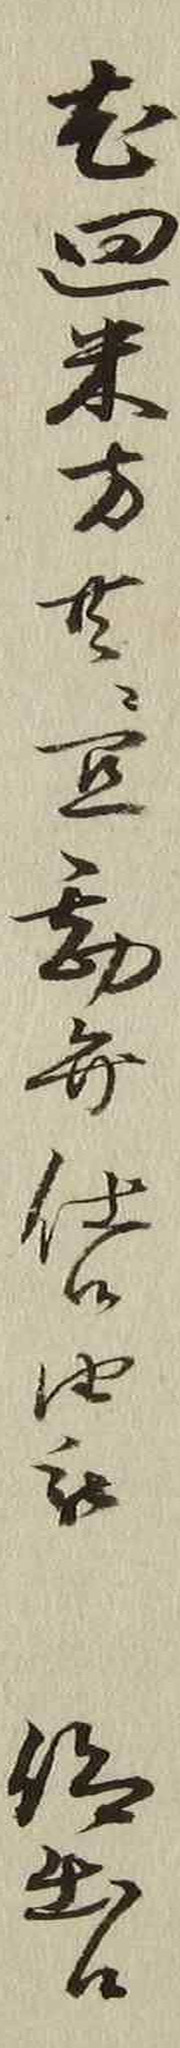尤廻米方共ニ宜勘弁仕候由被仰出候
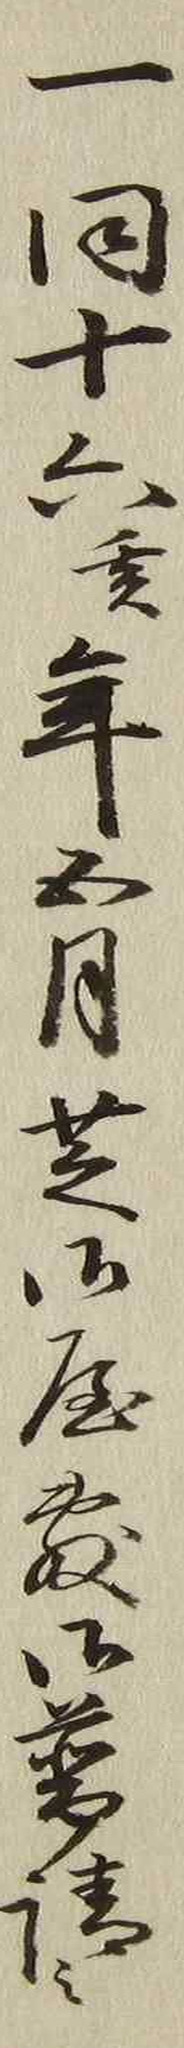一同十六亥年五月芝御屋敷御普請之
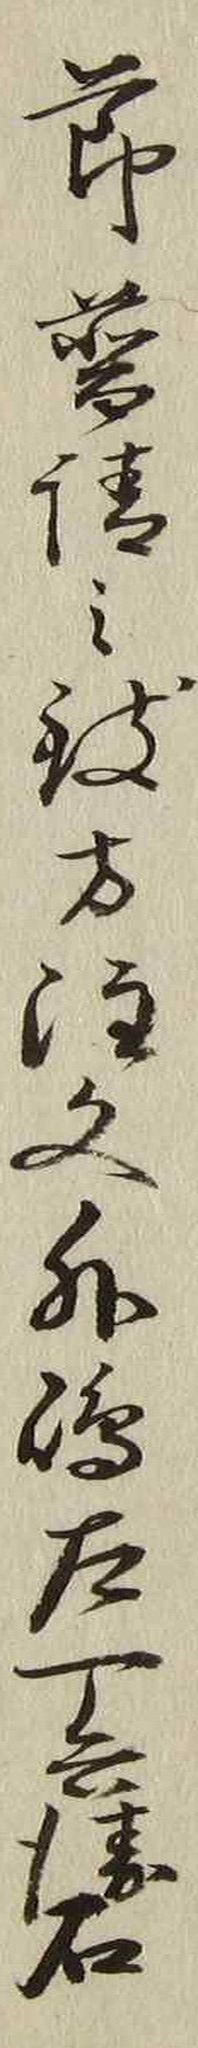節普請之致方注久外嶋左一兵衛石
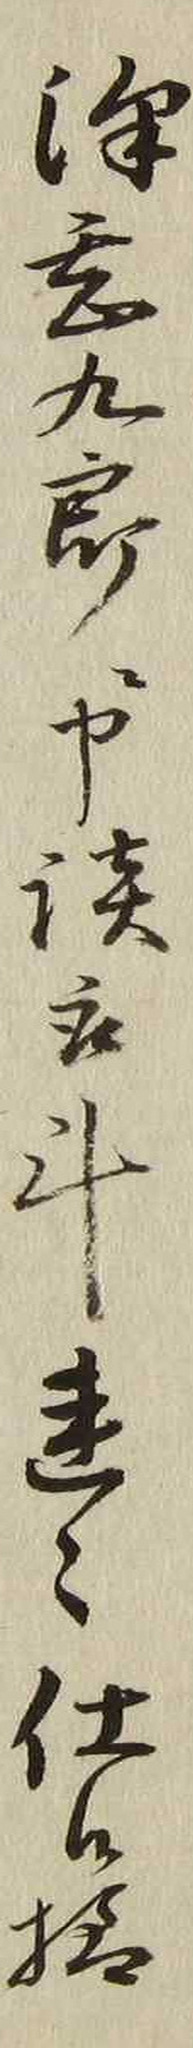澤甚九郎ニ申談取計連々仕候様
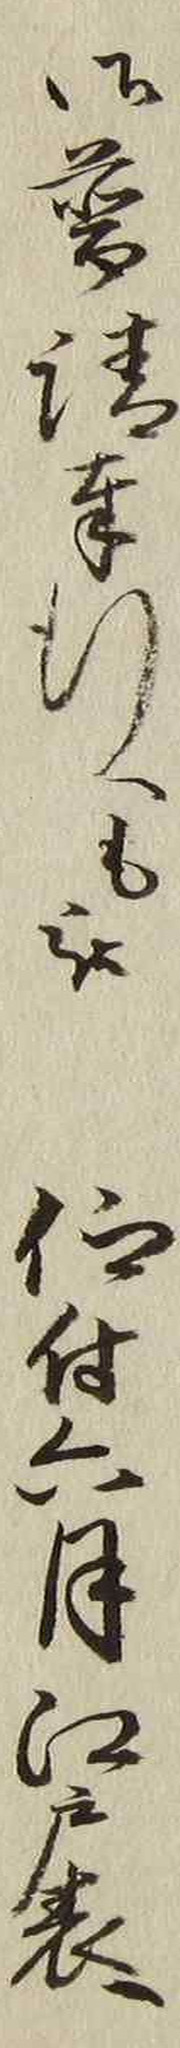御普請奉行へも被仰付六月江戸表へ
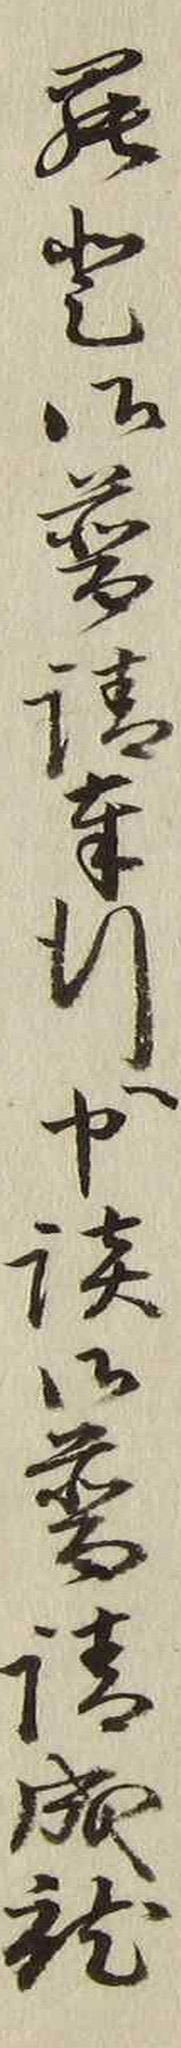罷登御普請奉行へ申談御普請成就
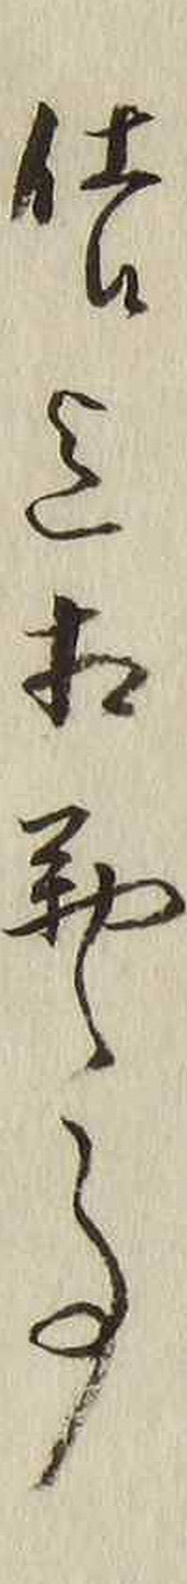仕候迄相勤候事
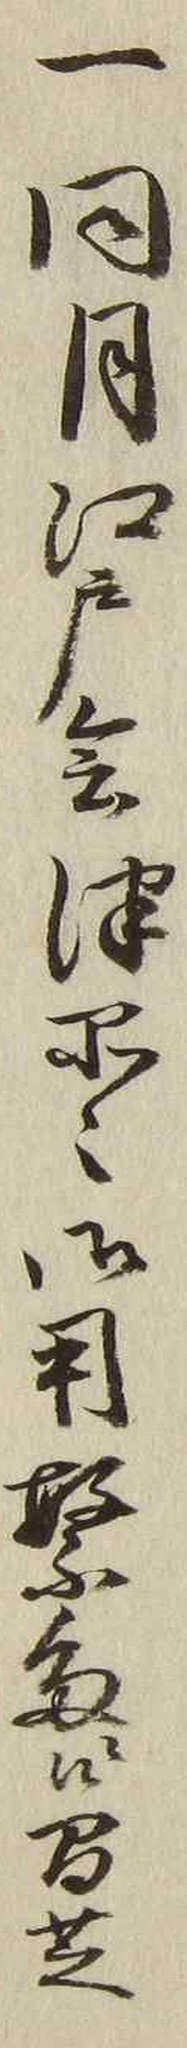一同月江戸会津品々御用繁多ニ候間芝

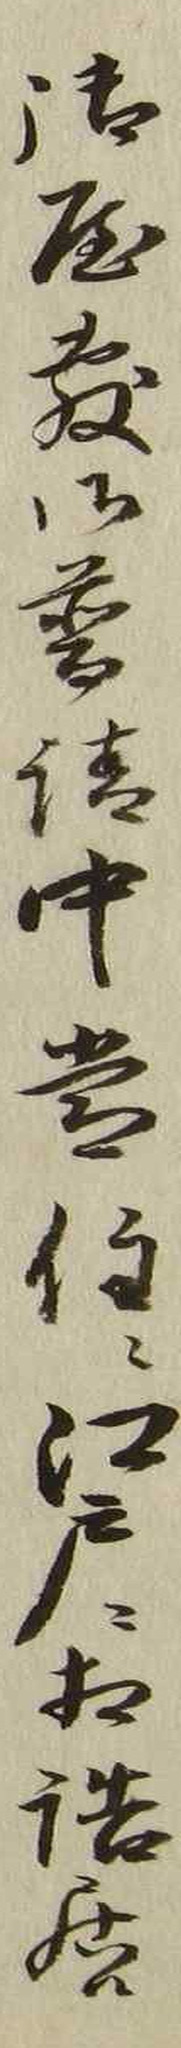御屋敷御普請中常住ニ江戸ニ相詰居候
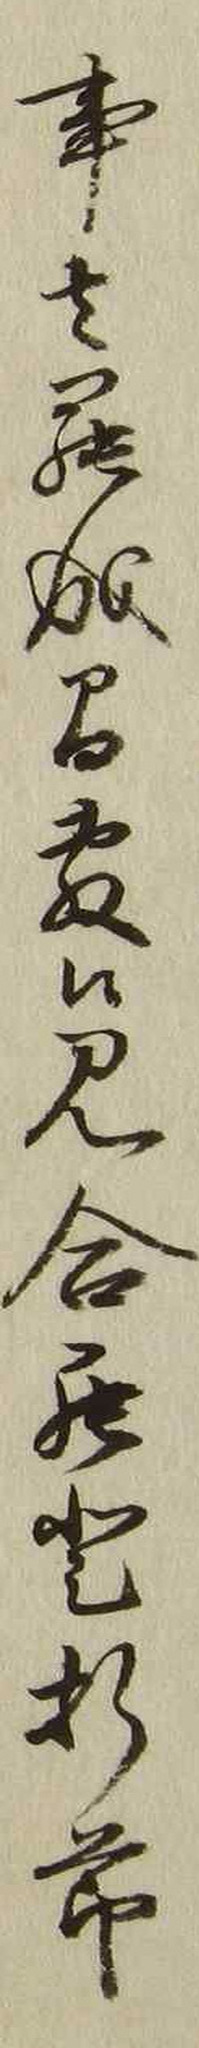事者罷成間敷候見合罷登折節
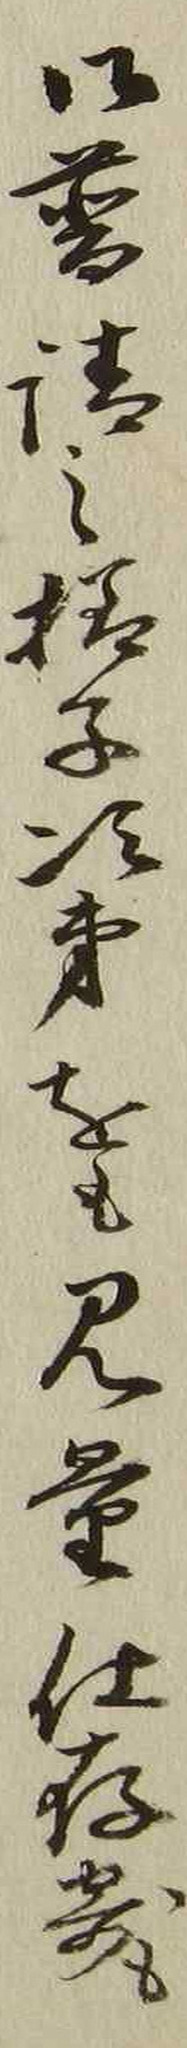御普請之様子次第をも見量仕存寄も
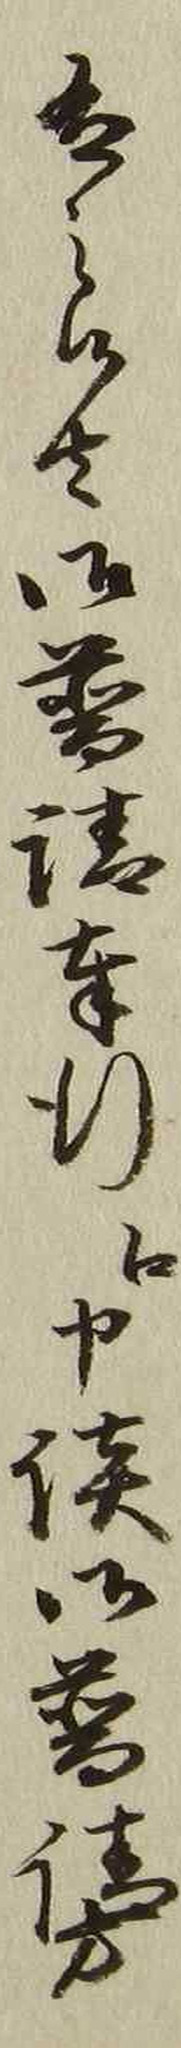有之候者御普請奉行江申談御普請方
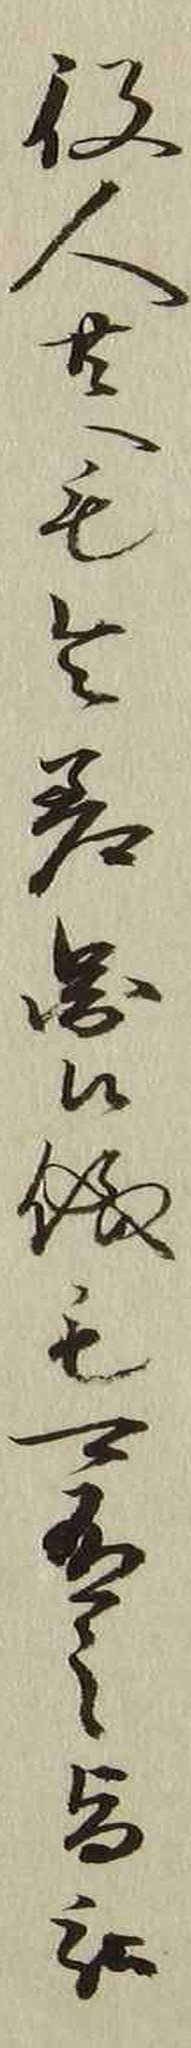役人共へも令差図候儀も可有之旨被
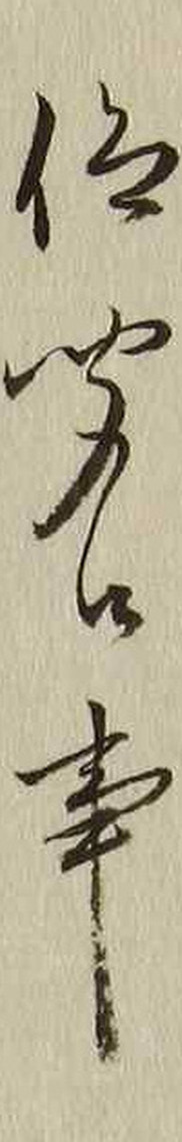仰聞候事
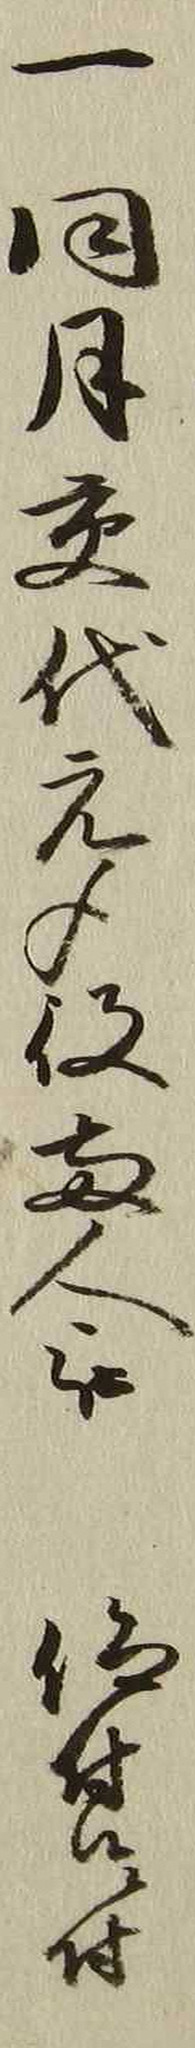一同月交代元〆役両人被仰付候ニ付
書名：諸士系譜　巻之61　と之部4
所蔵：会津若松市立会津図書館
